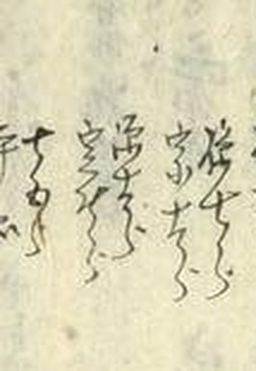源次郎
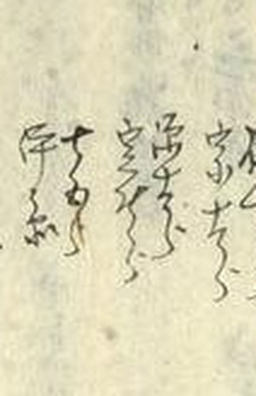亀次郎
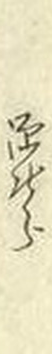源次郎
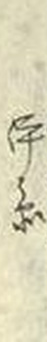久兵衛
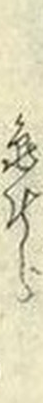亀次郎
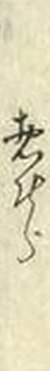亀次郎
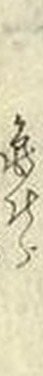亀次郎
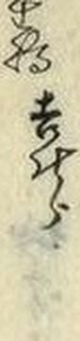亀次郎
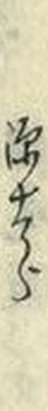源次郎
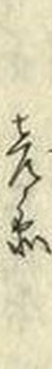久兵衛
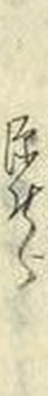源次郎

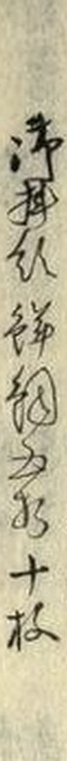御拝領鮮鯛五折拾枚
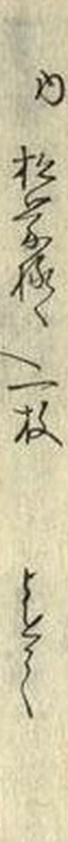内松栄院様へ一枚被進之
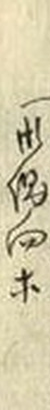御側向等
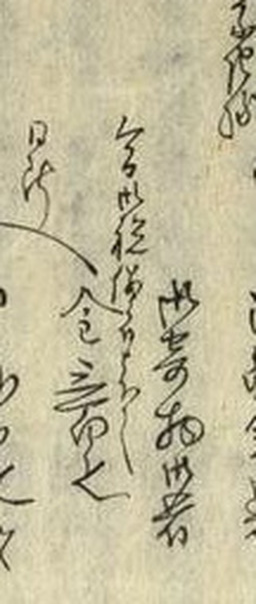今日御祝儀ニ付被下之
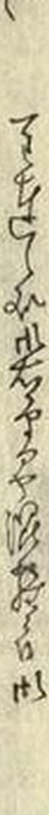通達之処御右筆部屋混雑ニ付御
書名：少傅日録抄（斉善付側向頭取日記、在府）
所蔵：福井県文書館 Fukui Prefectural Archives
